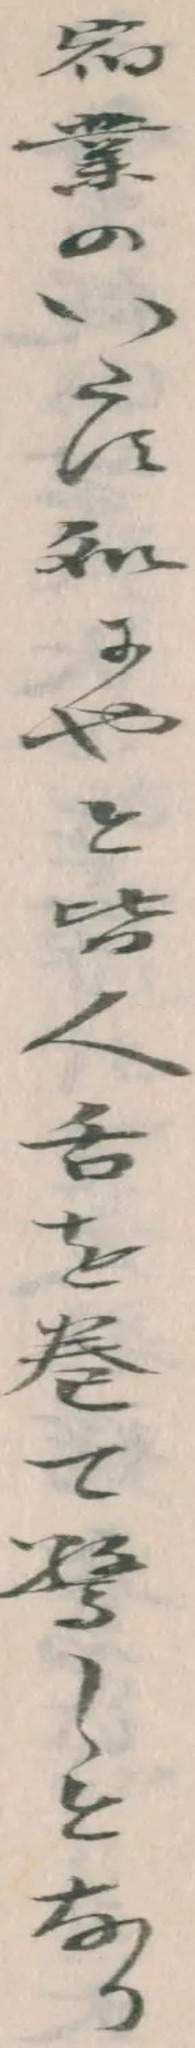宿業のいたす処にやと皆人舌を巻て驚きしとなり
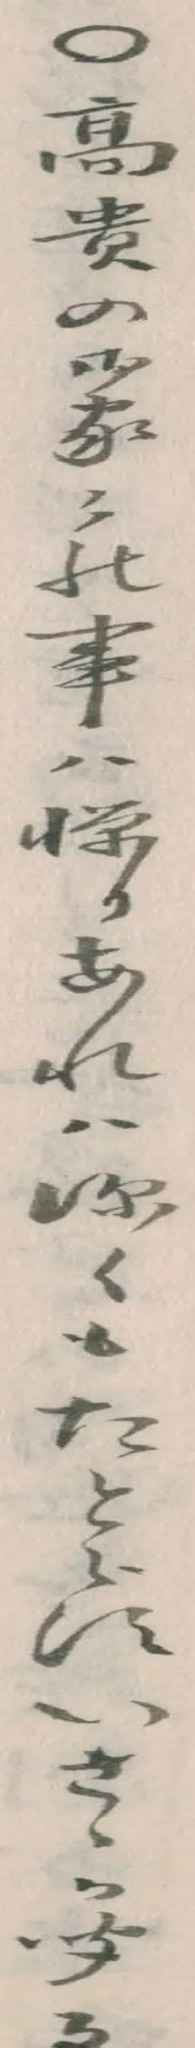〇高貴の御家かの事は憚りあれは深くもたとらすいさゝか聞る
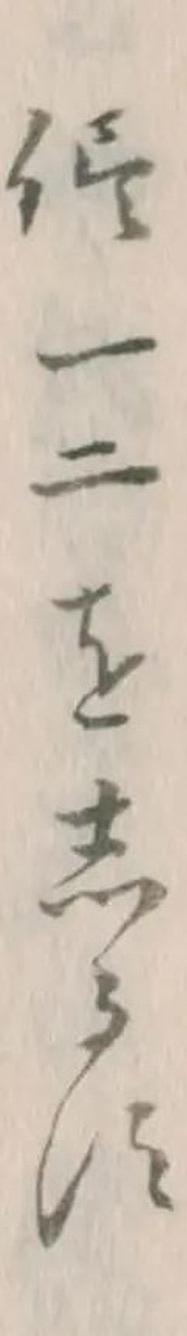侭一二をしるす
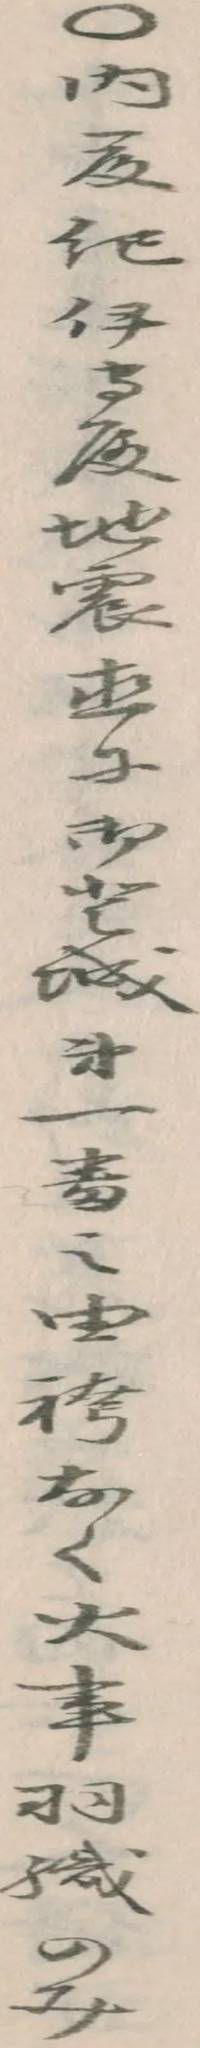〇内藤紀伊守殿地震直に御登城第一番之由袴なく火事羽織のみ

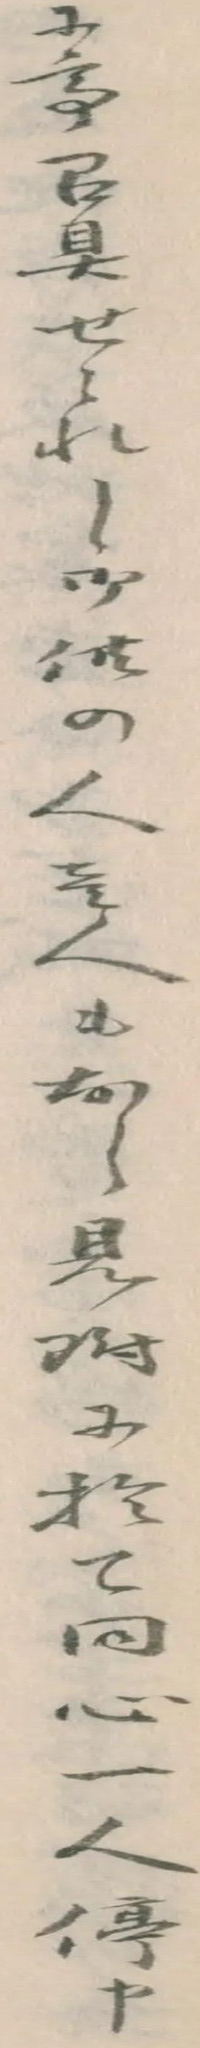にて召具せられし御供の人壱人もなし見附に於て同心一人停申
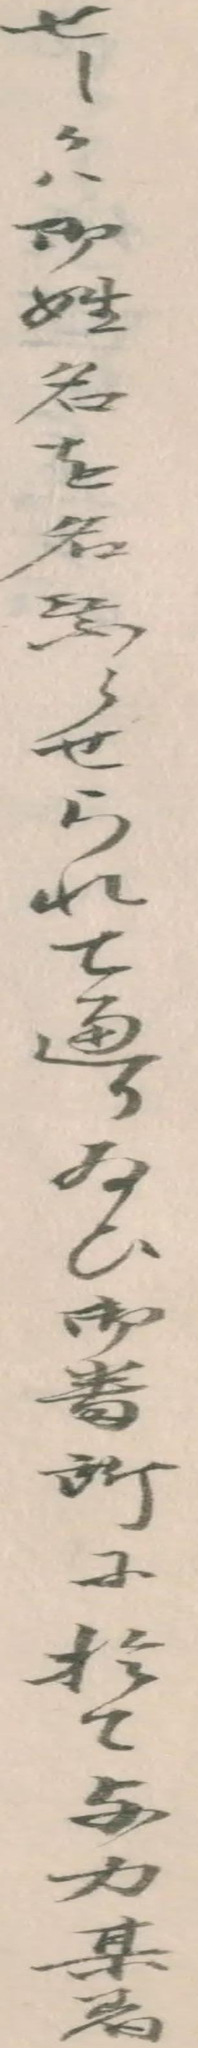せしかは御姓名を名乗らせられて通り給ひ御番所に於て与力某着
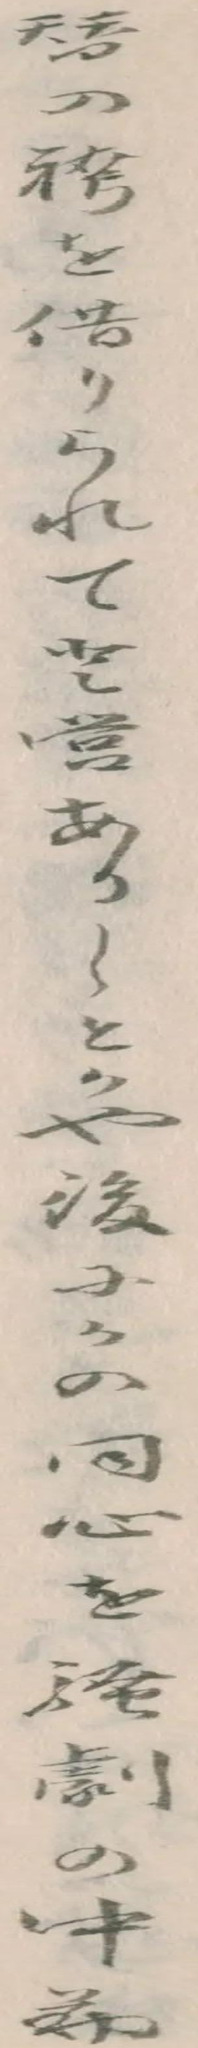替の袴を借りられて登営ありしとかや後にかの同心を騒劇の中勤
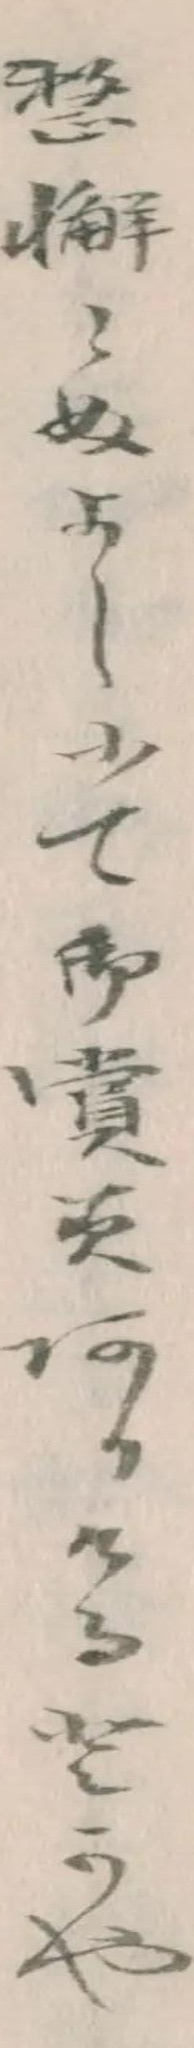整懈らぬよしにて御賞美ありけるとかや
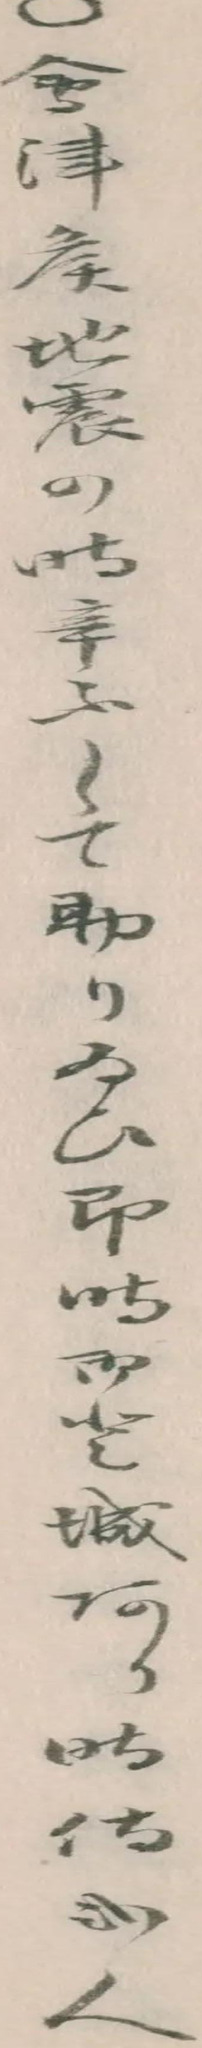〇会津侯地震の時辛ふして助り給ひ即時御登城あり時侍弐人
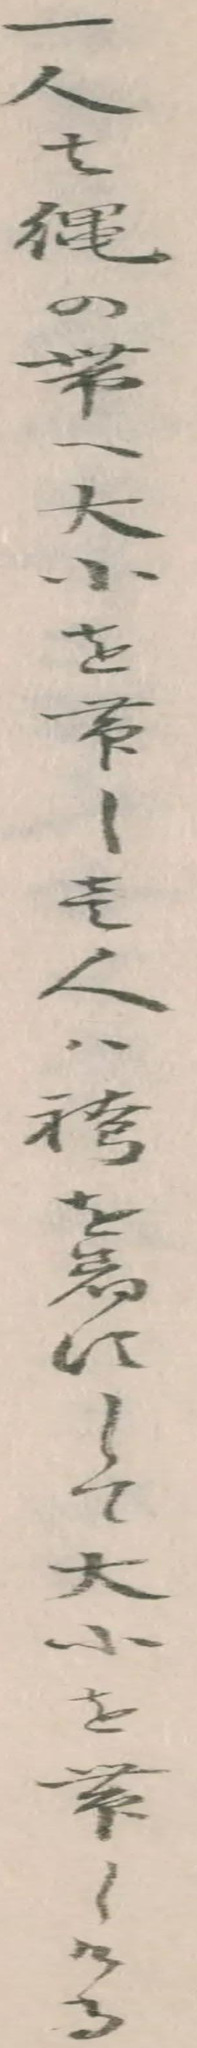一人は縄の帯へ大小を帯し壱人は袴を着すして大小を帯しける
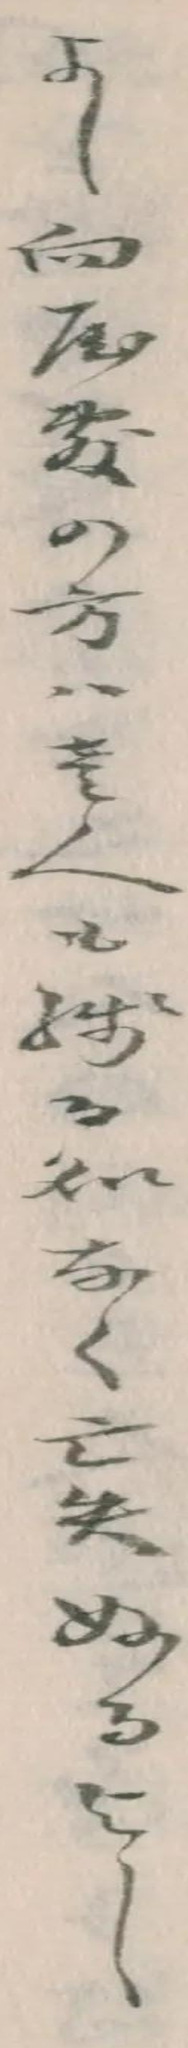よし向屋敷の方は壱人も残る処なく亡失ぬるよし
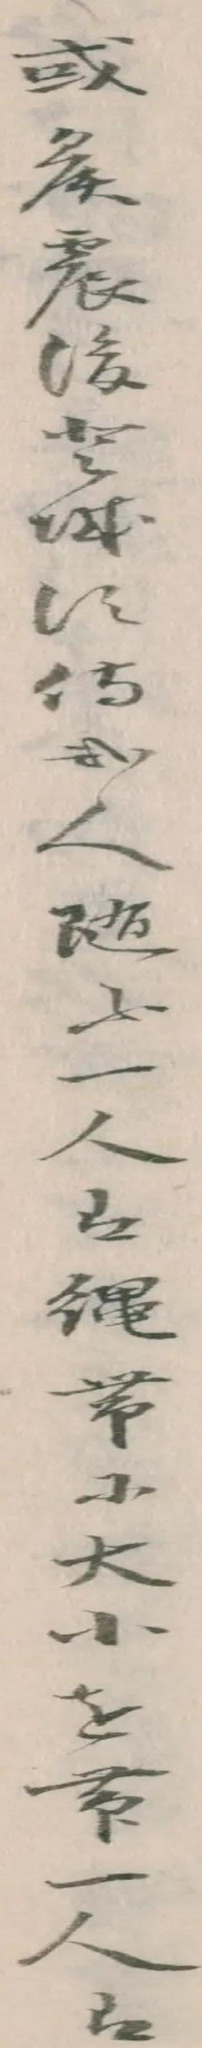或侯震後登城す侍弐人随ふ一人は縄帯に大小を帯一人は
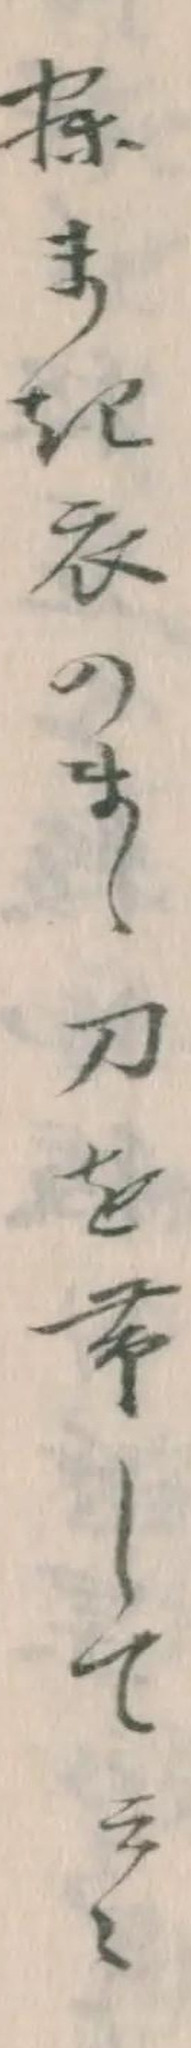寝まき衣のまゝ刀を帯して云々
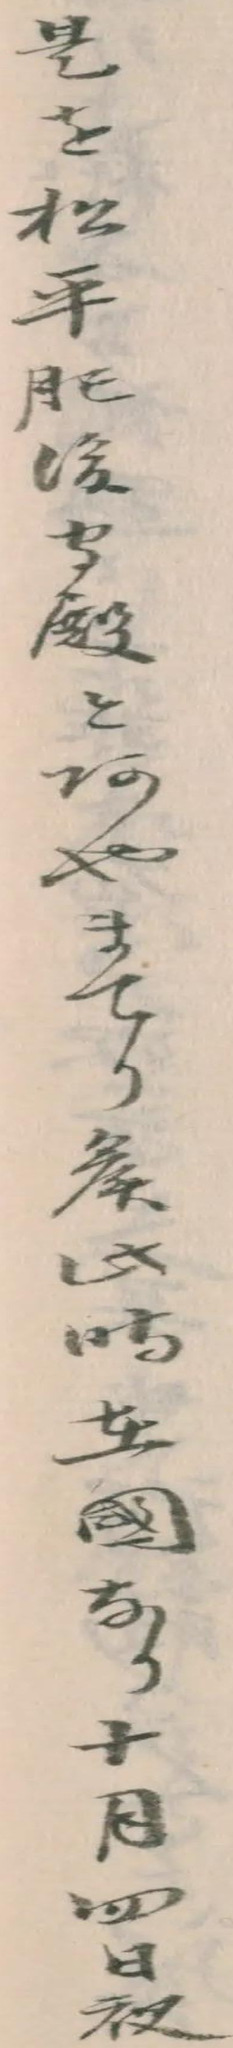是を松平肥後守殿とあやまてり侯此時在国なり十月四日夜
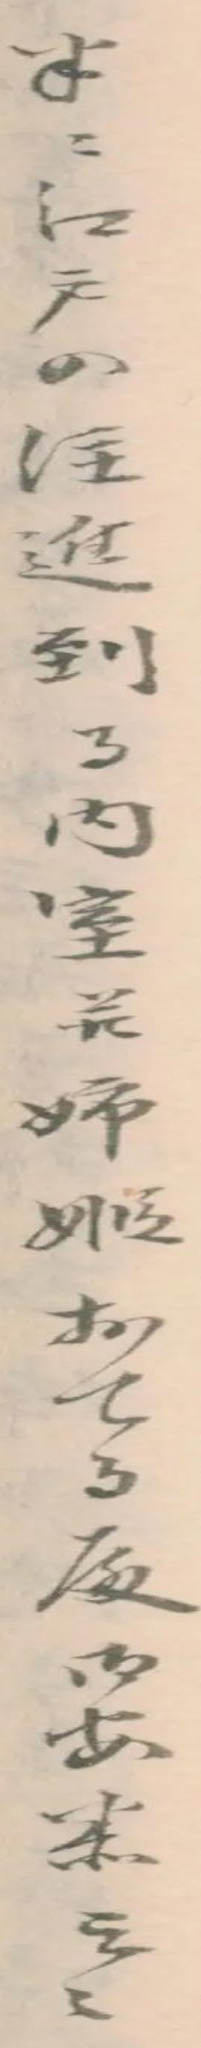半に江戸の注進到る内室并姉姫おてる殿御安泰云々
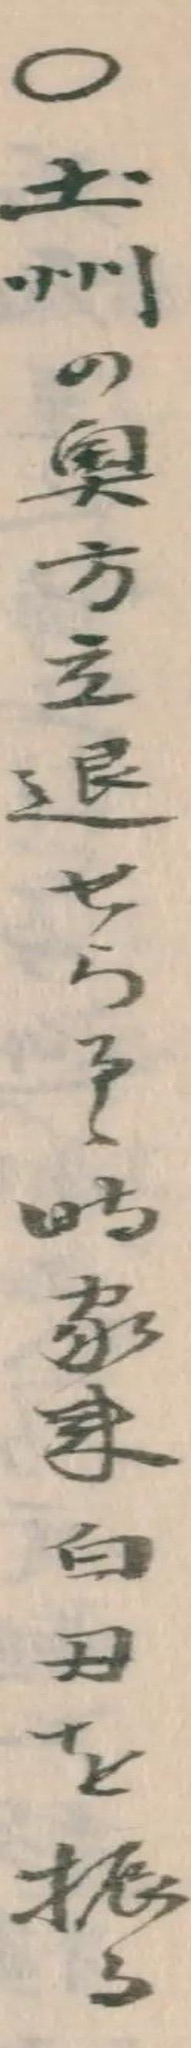〇土州の奥方立退きせらるゝ時家来白刃を振る
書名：地災撮要. 巻10(地震之部) 上,下
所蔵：国立国会図書館 National Diet Library, JAPAN
